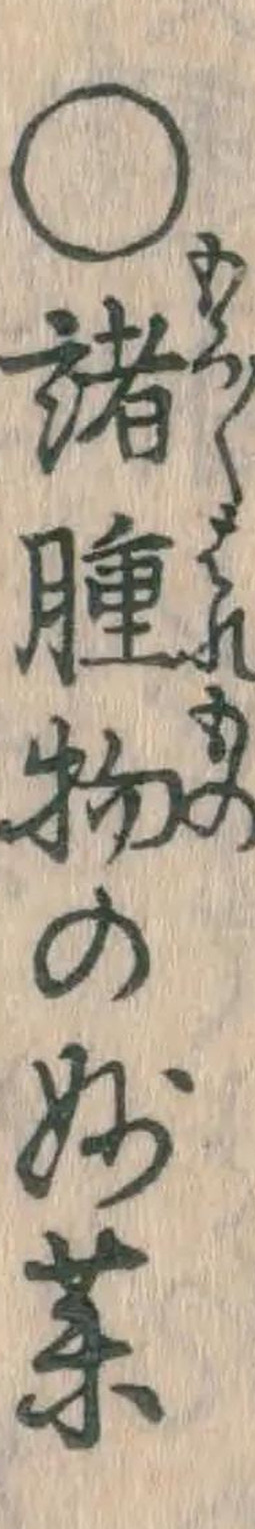○諸腫物の妙薬
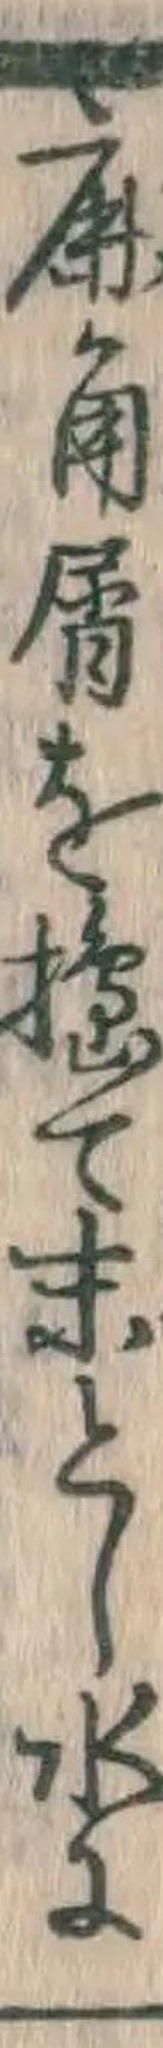鹿角屑を搗て末とし水に
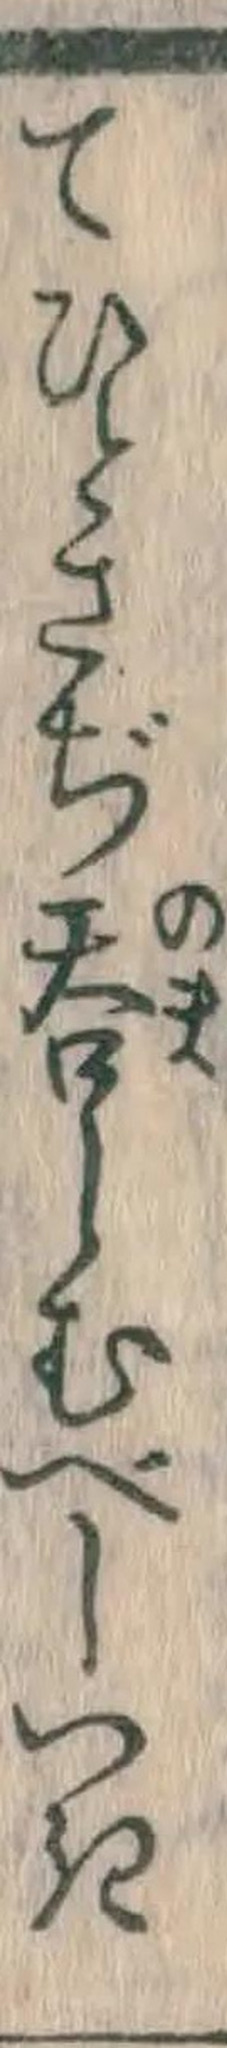てひとさぢ吞しむべしつき
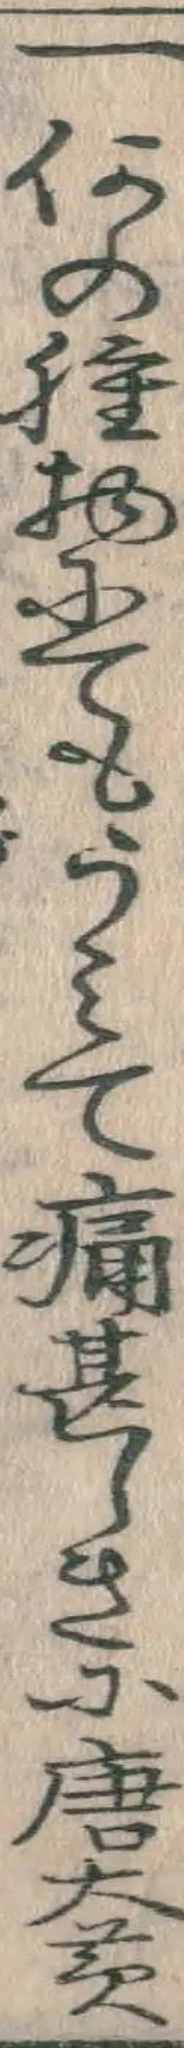一何の腫物にてもうみて痛甚しきに唐大黄
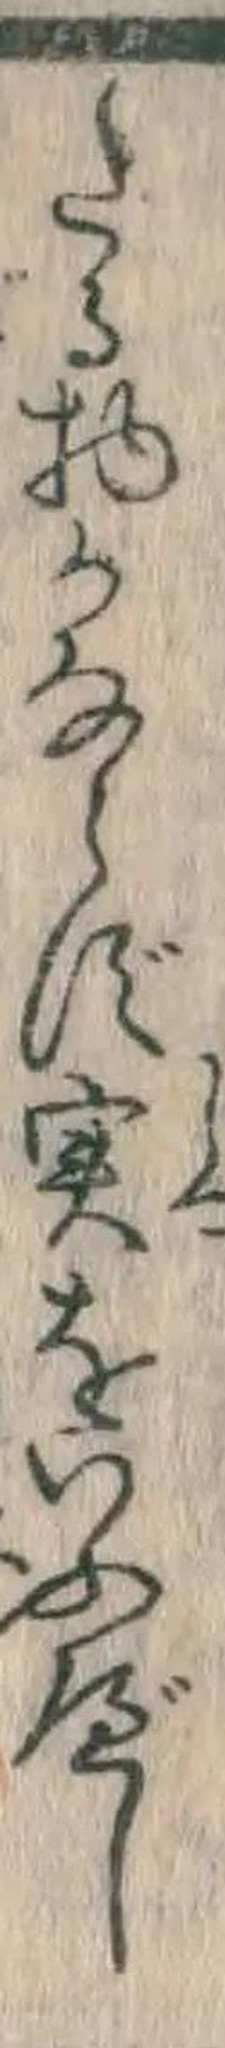たる物かならず実をいふべし
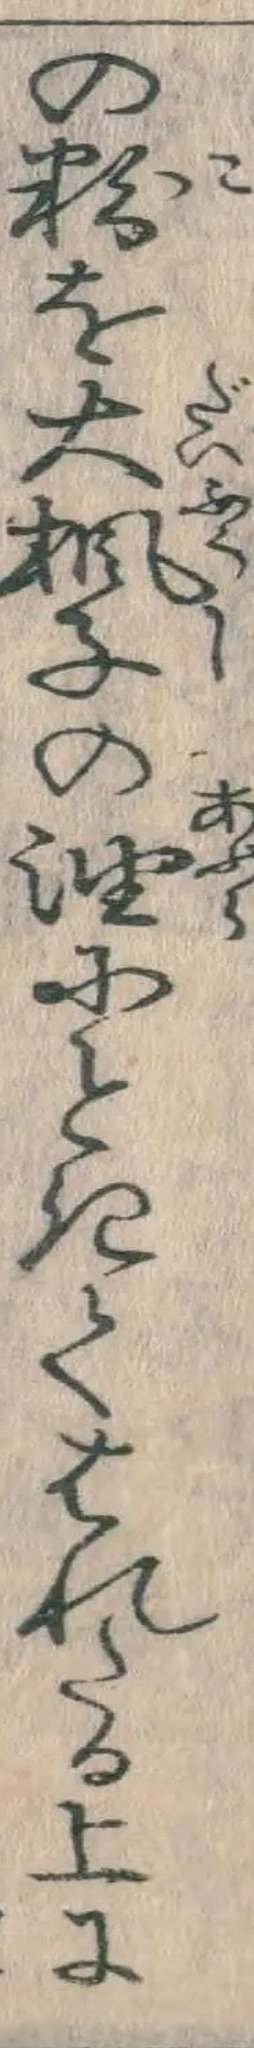の粉を大楓子の油にときてはれたる上に
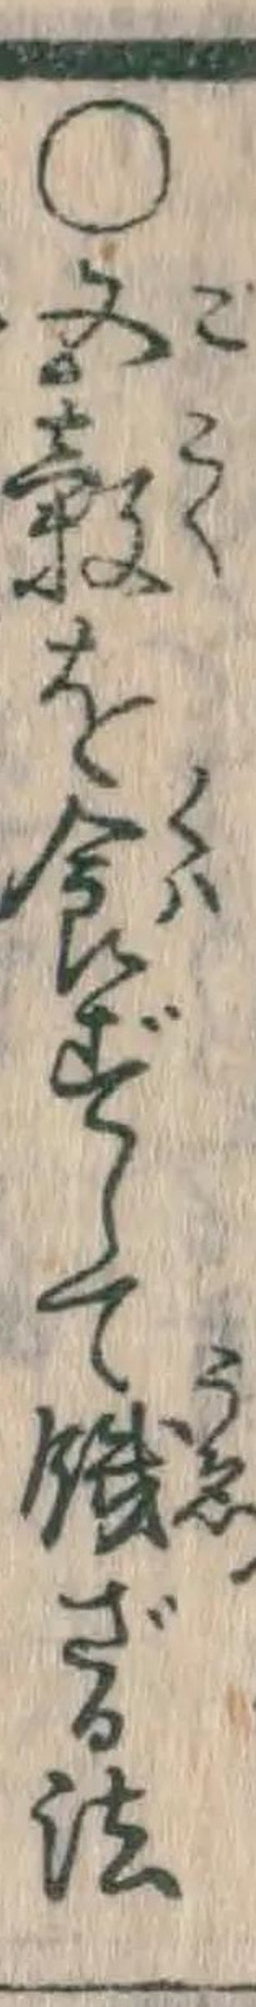○五穀を食ずして餓ざる法
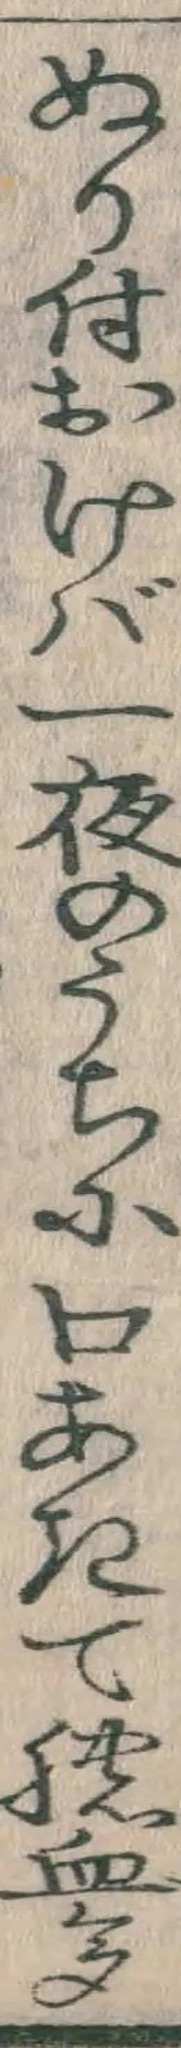ぬり付おけば一夜のうちに口あきて膿血多
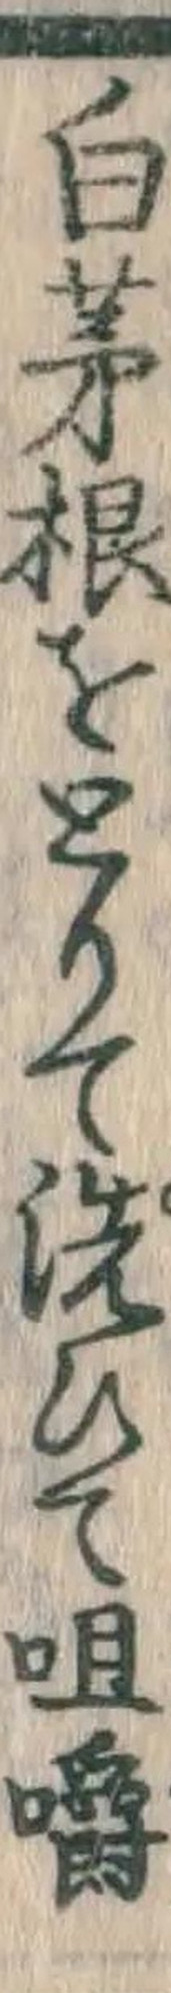白茅根をとりて洗ひて咀嚼
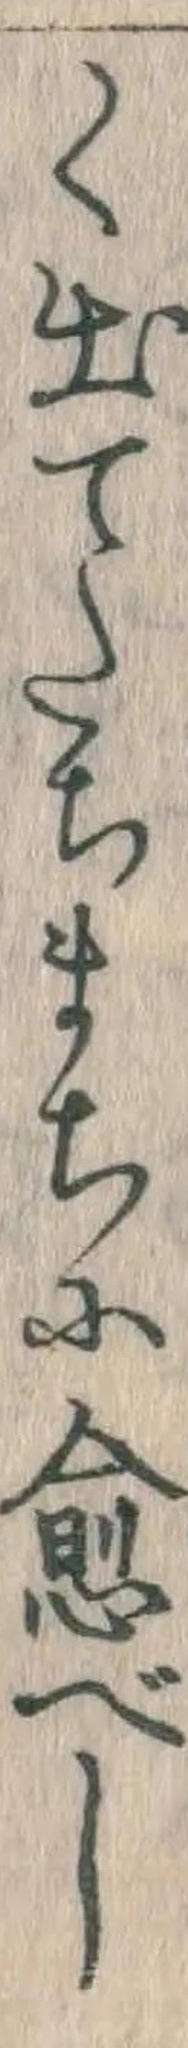く出てたちまちに愈べし
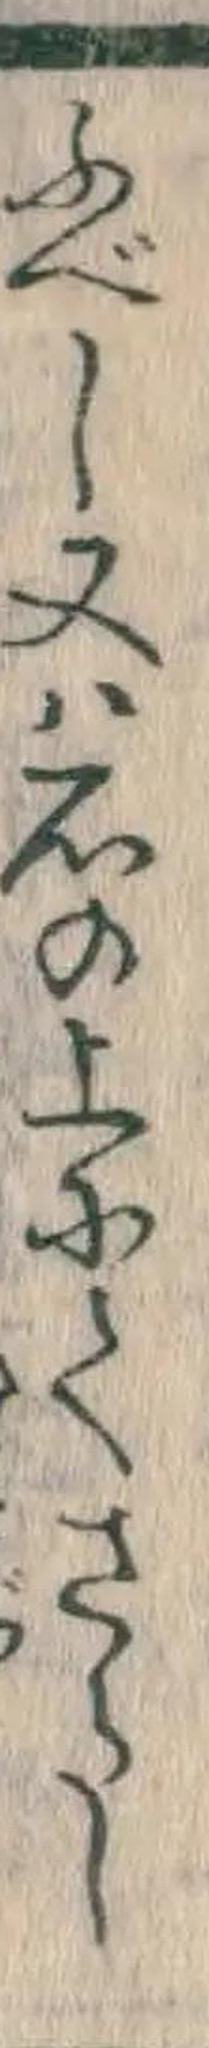ふべし又は石の上にてさらし
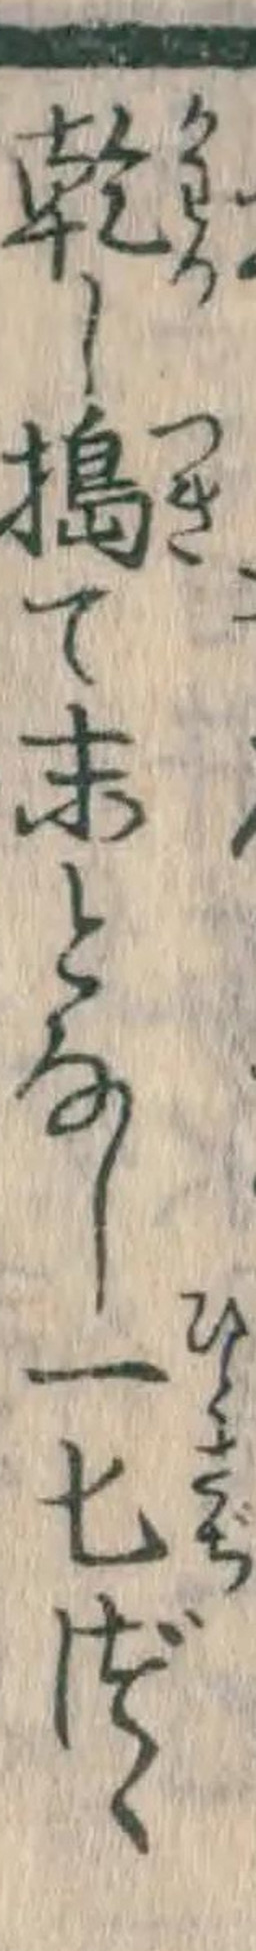乾し搗て末となし一匕づゝ
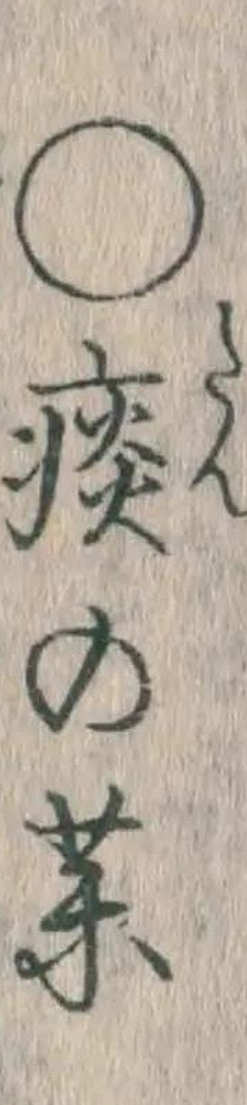○痰の薬
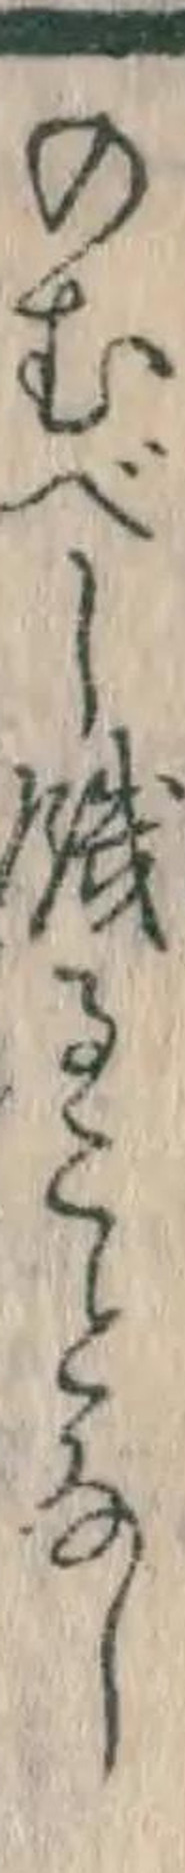のむべし餓ることなし
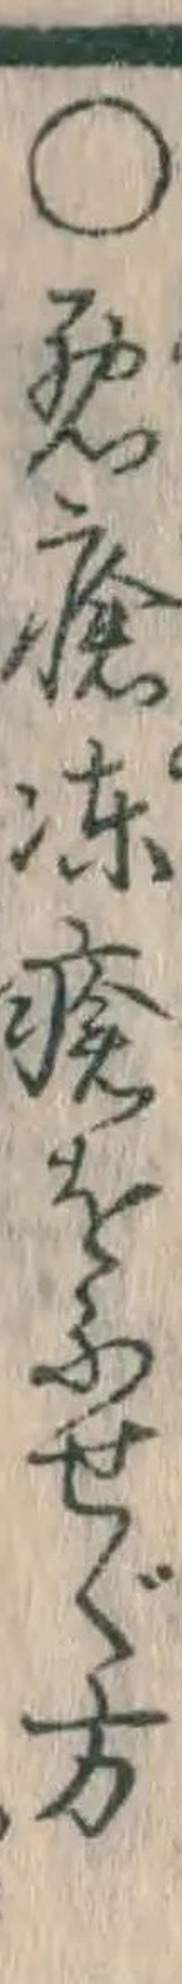○悪瘡凍瘡をふせぐ方
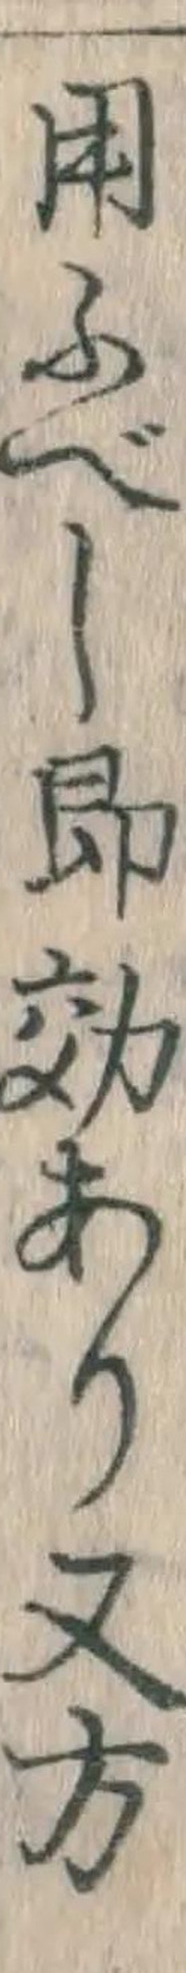用ふべし即効あり又方
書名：広益秘事大全 3巻. [4]
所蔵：国立国会図書館 National Diet Library, JAPAN
